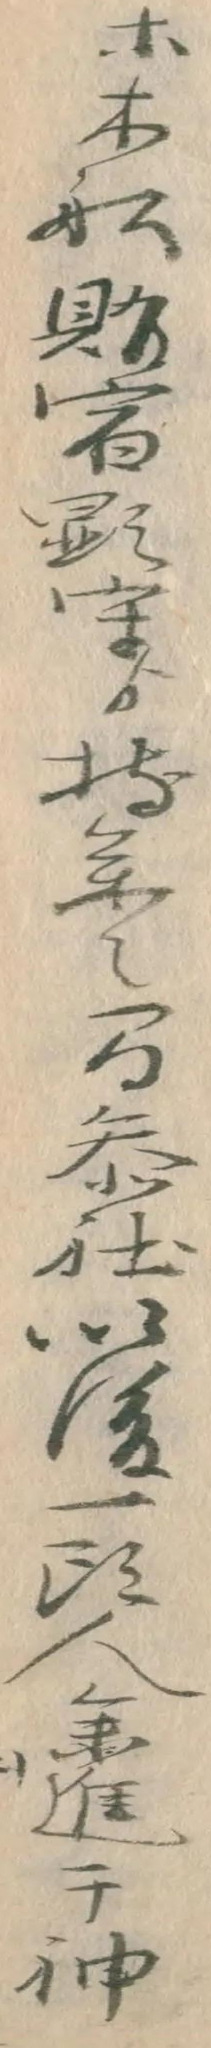等木舩賄宿顕守ゟ持参之間参社以後一頭人参進于神

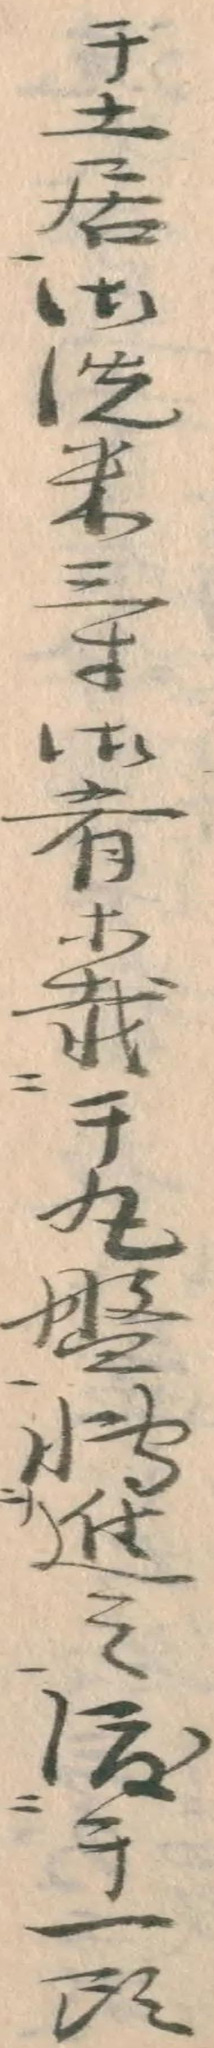于土居御洗米三寸御肴等載于丸盤轉進之渡于一頭
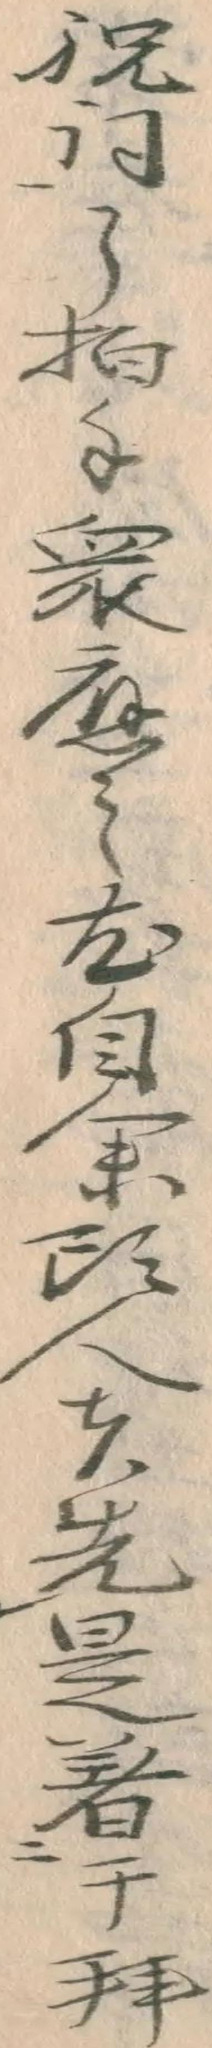祝詞了拍手衆應之尤自余頭人者先是着于拝
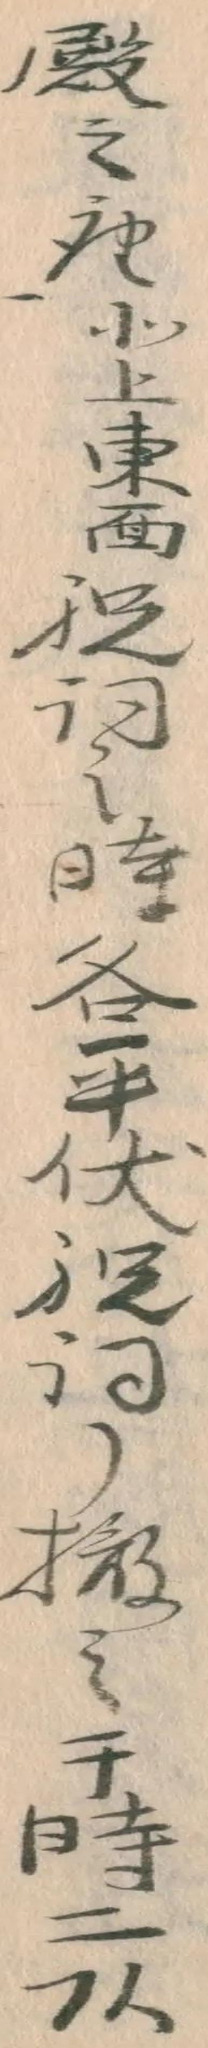殿之座北上東面祝詞之時各平伏祝詞了撤之于時二頭
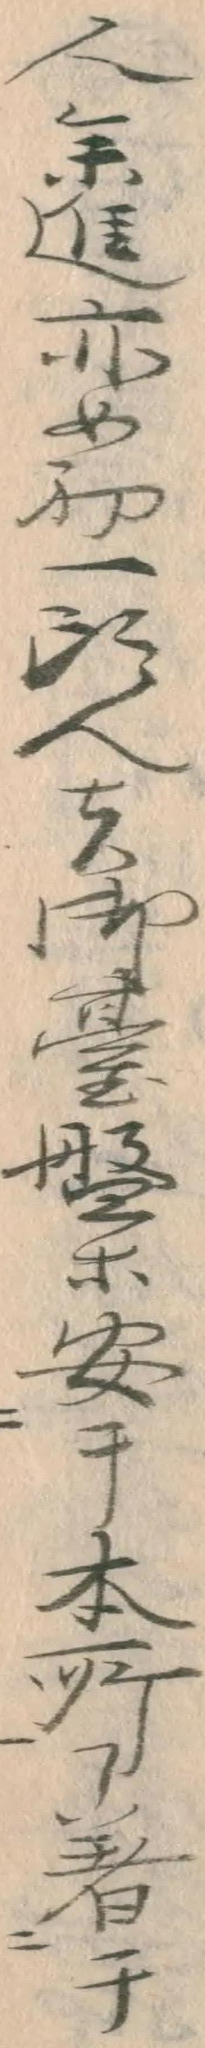人参進亦如初一頭人者御臺盤等安于本所了着于
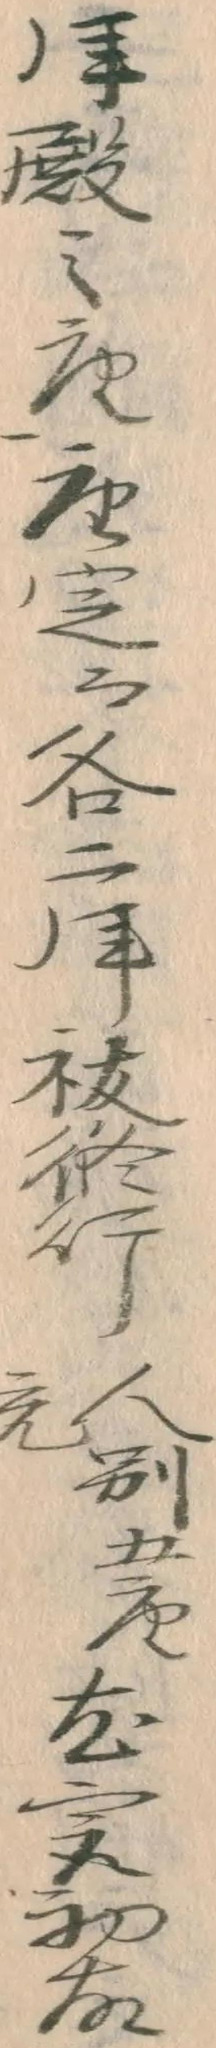拝殿之座座定而各二拝祓修行人別五座充尤最初故
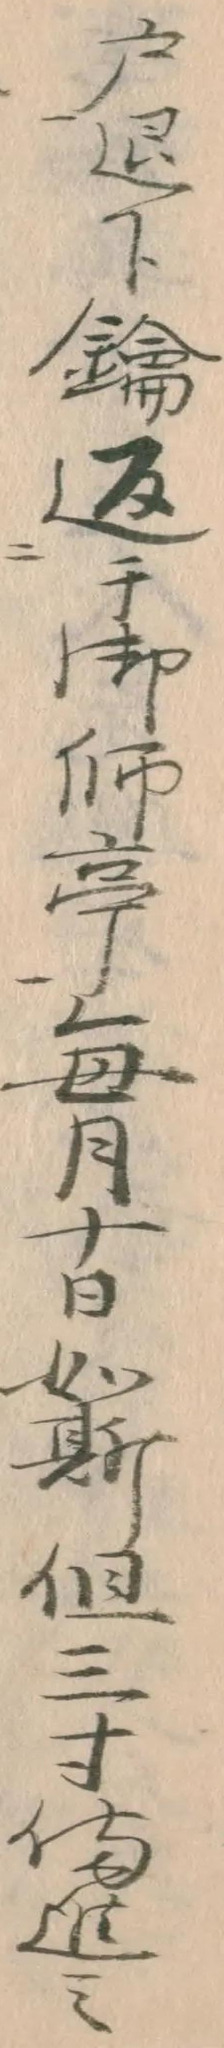戸退下鑰返于御師亭毎月十日如斯但三寸備進之
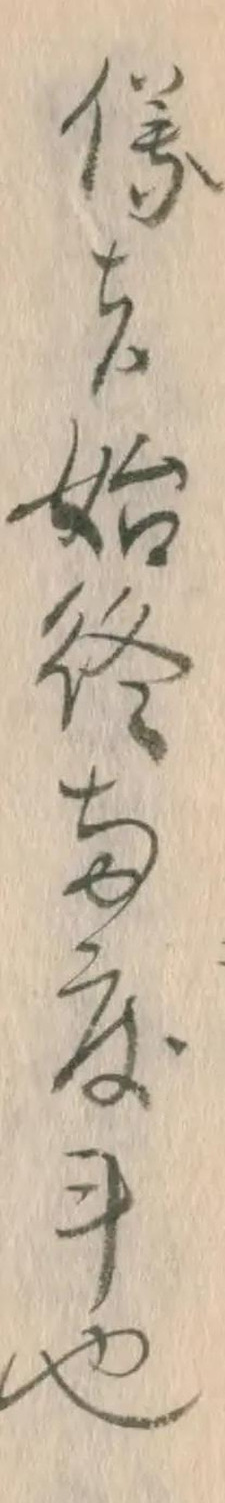儀は始終両度斗也
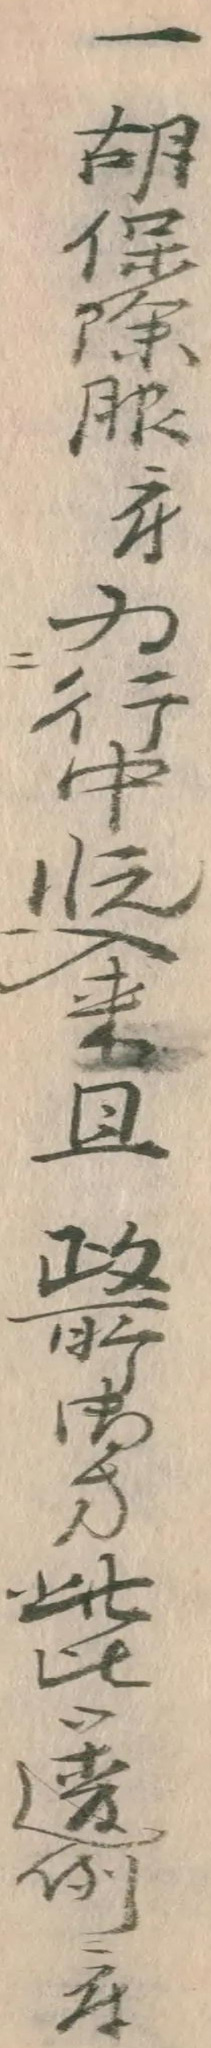一胡保除服ニ付為行中悦入来且政所御方此比御違例ニ付
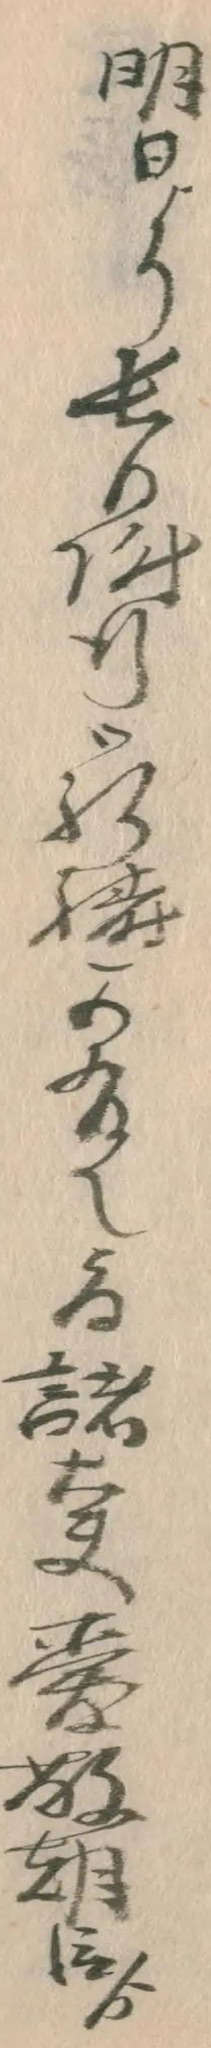明日より長日附行御祈祷可有之旨諸大夫愛敬朝臣ゟ
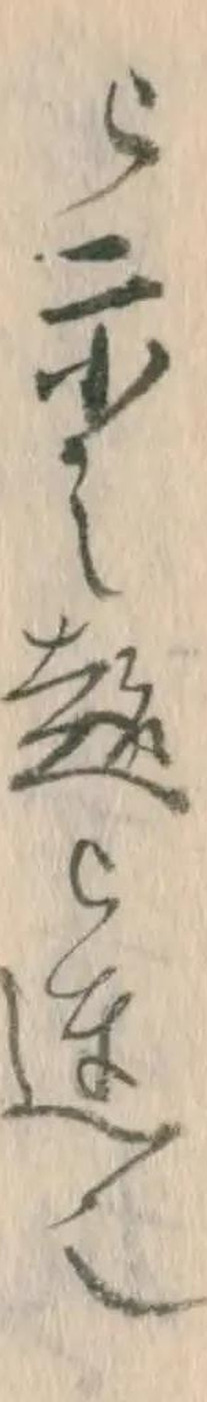被示之趣被達也
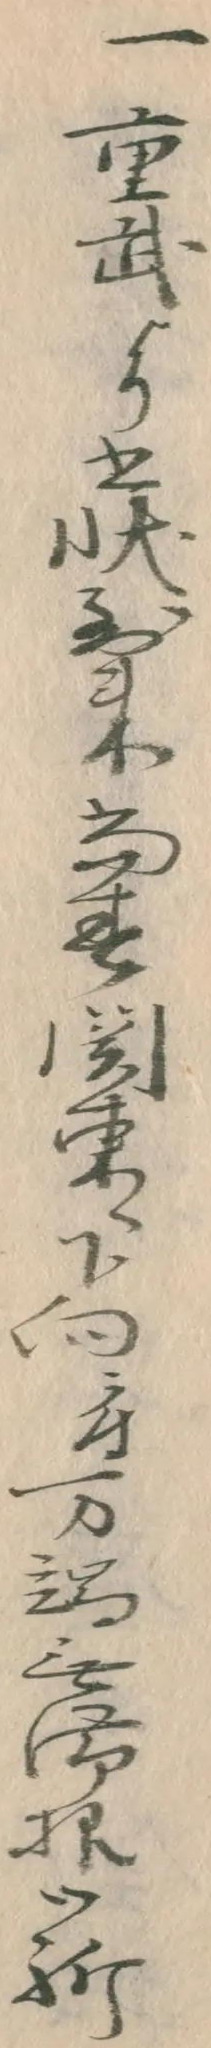一重武より書状到来當春関東へ下向ニ付万端無滞様御祈
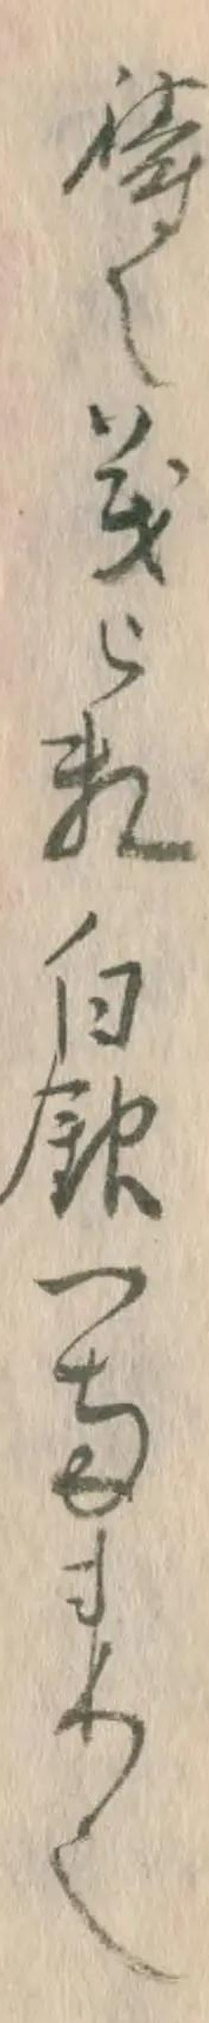祷之義被頼白銀一両来也
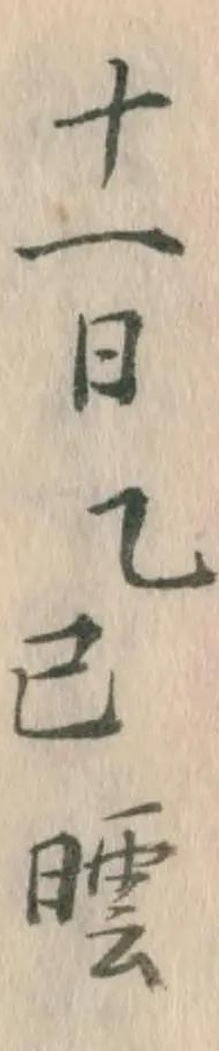十一日乙巳曇
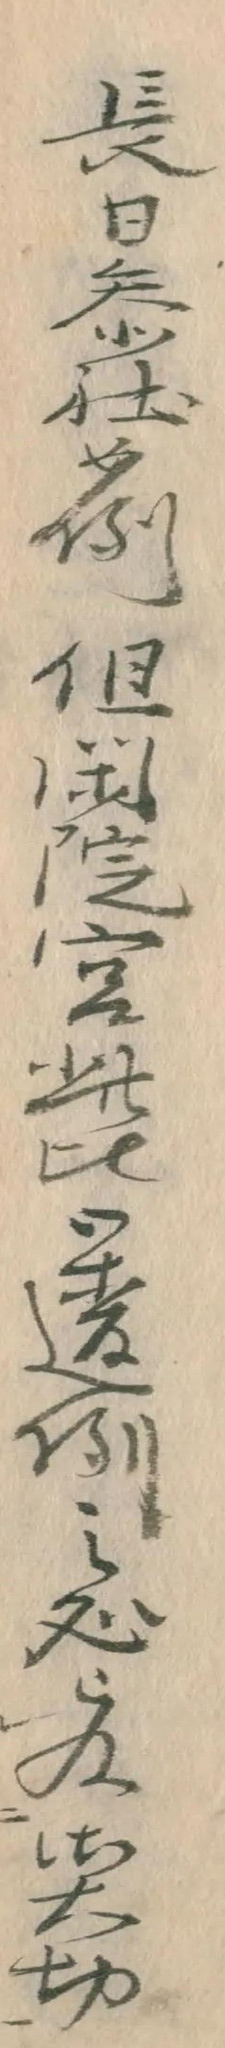一長日参社如例但閑院宮此頃御違例之処被及御大切

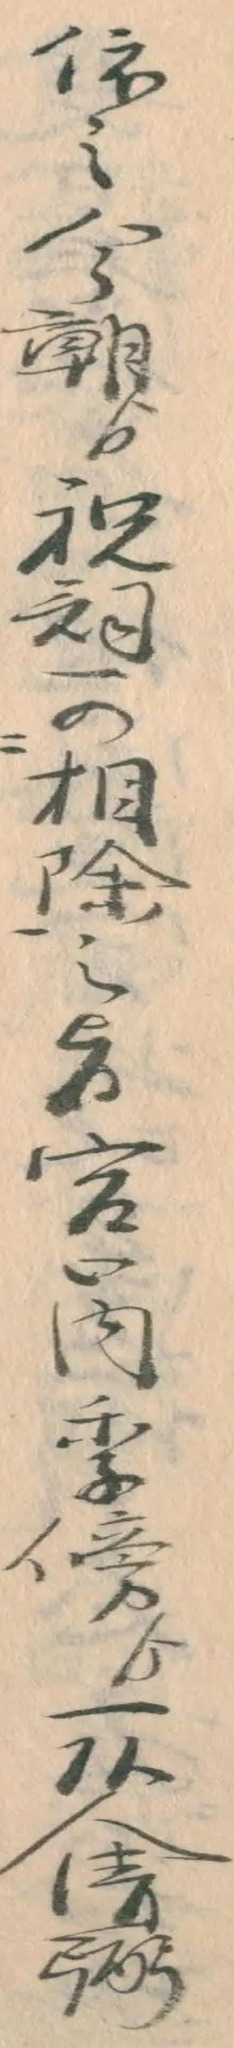依之今朝ゟ祝詞可相除之旨宮御内季傍ゟ一頭人清弼
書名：賀茂社記録. 第72冊
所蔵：国立国会図書館 National Diet Library, JAPAN
